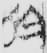於
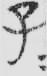子子
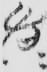左左
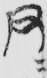尹尹
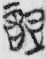○（屬）
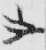之
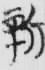新
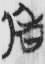俈
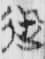○（卜）
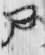尹
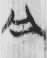丹
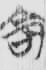命
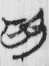爲
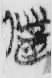○（僕）
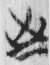至
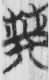典
